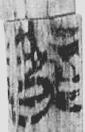○（聞）
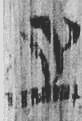之
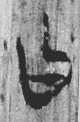曰
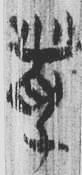○（一）
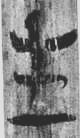生
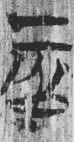兩
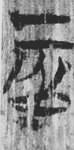兩
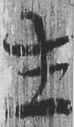生
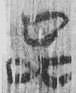厽（三）
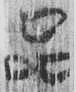晶
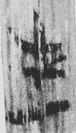生
